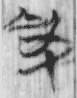事
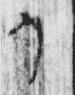人
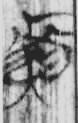○（早）
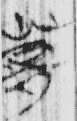○（暮）
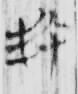救
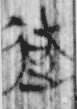适
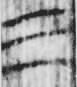三
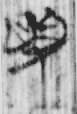受
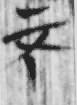不
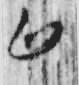㠯（以）
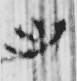出
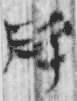阩
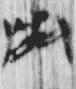門
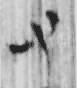又
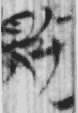敗
